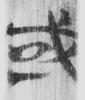或
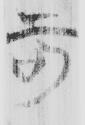可
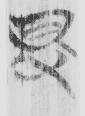𠭁
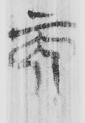而
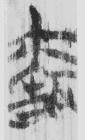{尒䎽}
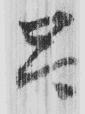也
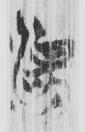湯
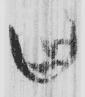曰
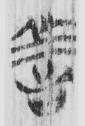善
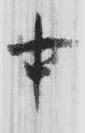才
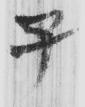子
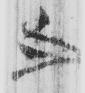之
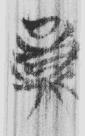員
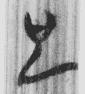也
